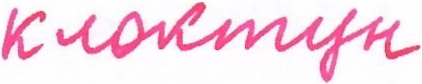клоктун
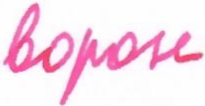ворон
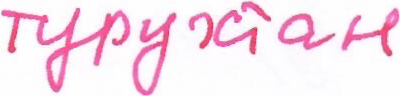турухтан
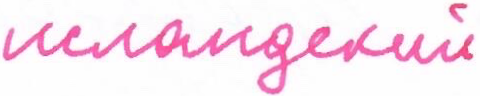исландский
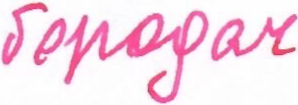бородач
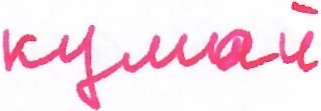кумай
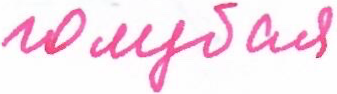голубая
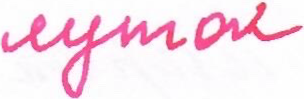луток
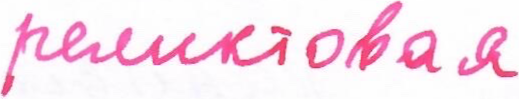реликтовая
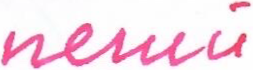пегий
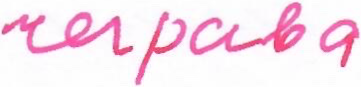чеграва
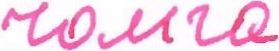чомга
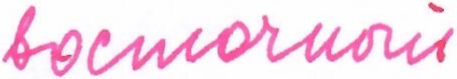восточный
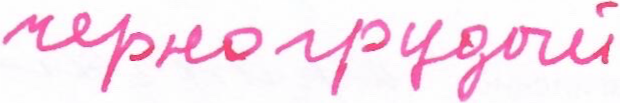черногрудый
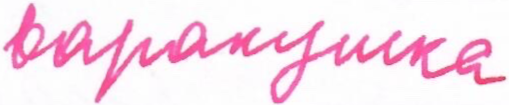варакушка
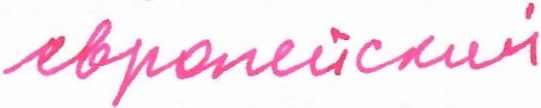европейский
